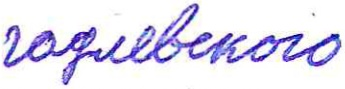годлевского
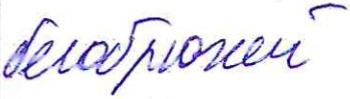белобрюхий
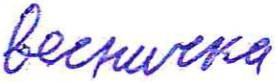весничка
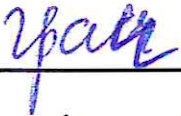грач
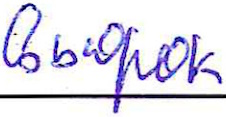вьюрок
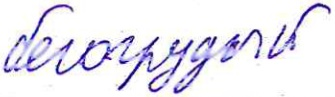бегогрудый
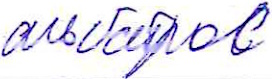альбатрос
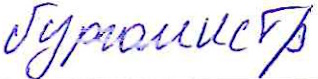бургомистр
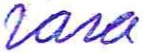гага
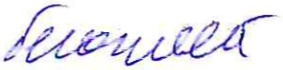белошеей
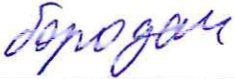бородач
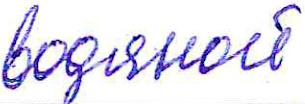водяной
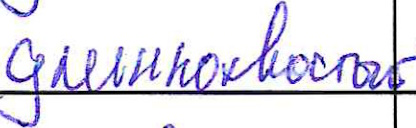длиннохвостый
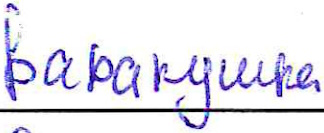варакушка
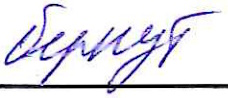беркут
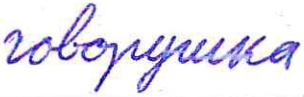говорушка
